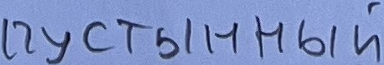пустынный
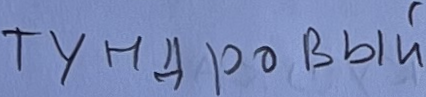тундровый
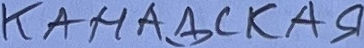канадская
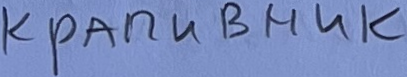крапивник
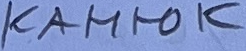канюк
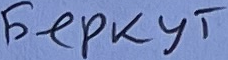беркут
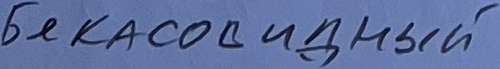бекасовидный
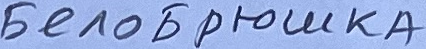белобрюшка
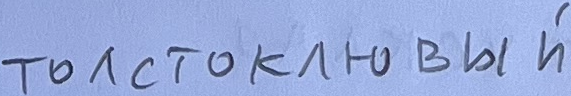толстоклювый
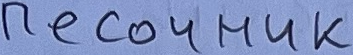песочник
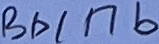выпь
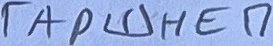гаршнеп
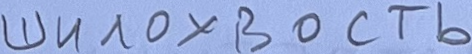шилохвость
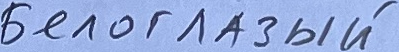белоглазый
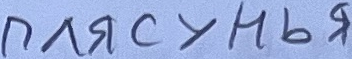плясунья
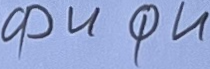фифи
